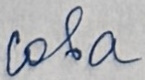сова
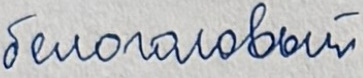белоголовый
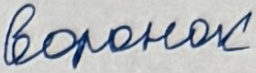воронок
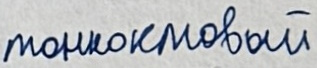тонкоклювый
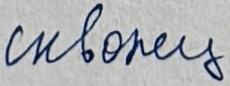сквопец
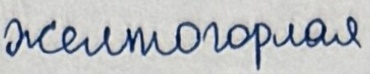желтогорлая
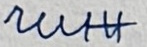чиж
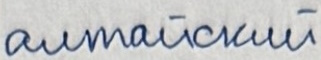алтайский
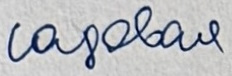садовая
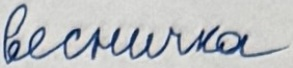весничка
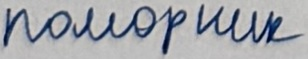поморник
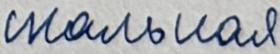скальная
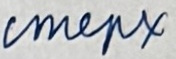стерх
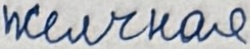желчная
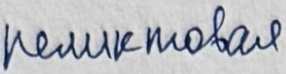реликтовая
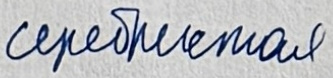серебристая
